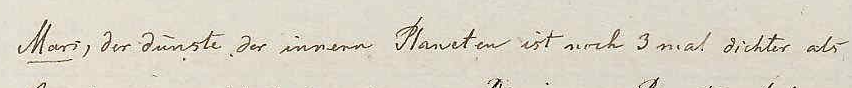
Mars, der dünste der innern Planeten ist noch 3 mal dichter als
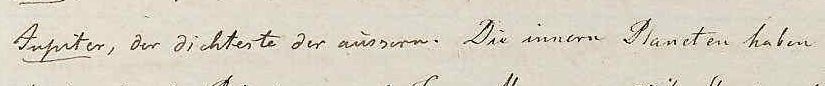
Jupiter, der dichteste der äussern. Die innern Planeten haben
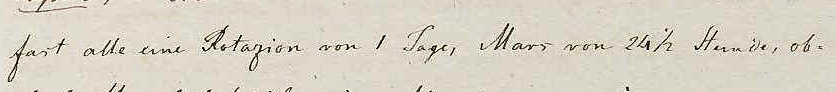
fast alle eine Rotazion von 1 Tage, Mars von 24½ Stunden, ob-
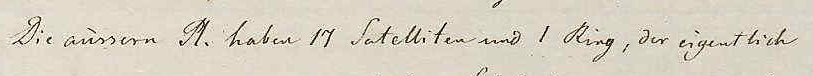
Die äussern Pl. haben 17 Satelliten und 1 Ring, der eigentlich
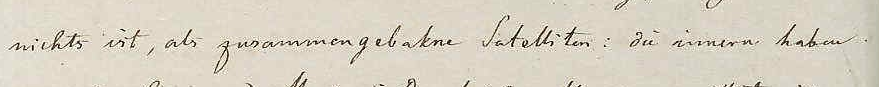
nichts ist, als zusammengebakne Satelliten: die innern haben
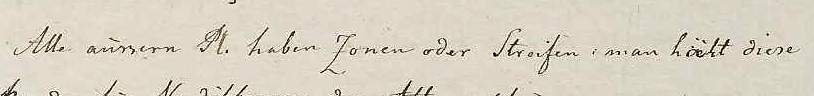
Alle äussern Pl. haben Zonen oder Streifen: man hieält diese
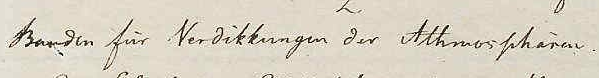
Banden für Verdikkungen der Athmosphären.
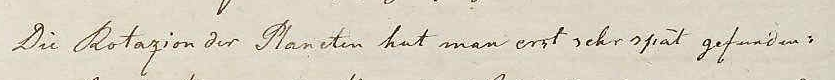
Die Rotazion der Planeten hat man erst sehr spät gefunden:
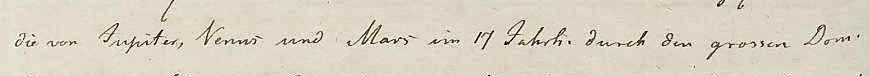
die von Jupiter, Venus und Mars im 17 Jahrh. durch den grossen Dom.
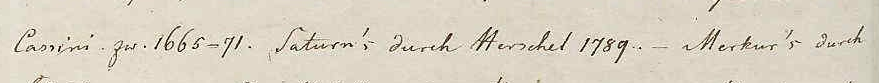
Cassini zw. 1665–71. Saturn's durch Herschel 1789. – Merkur's durch
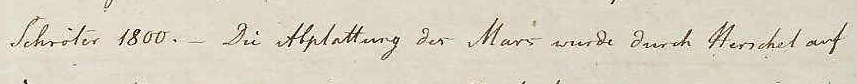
Schröter 1800. – Die Abplattung des Mars wurde durch Herschel auf
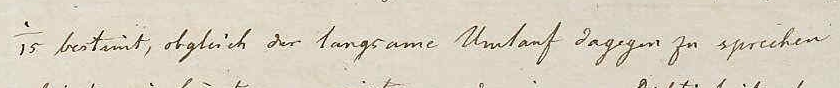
15 bestimt; obgleich der langsame Umlauf dagegen zu sprechen
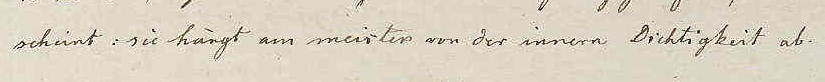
scheint: sie hängt am meisten von der innern Dichtigkeit ab.
